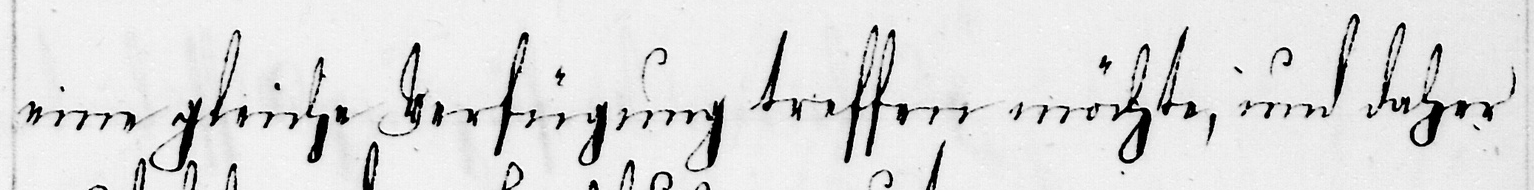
eine gleiche Verfügung treffen möchte, und daher
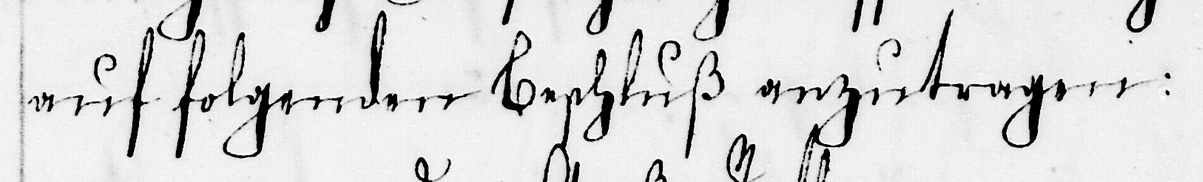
auf folgenden Beschluß anzutragen:
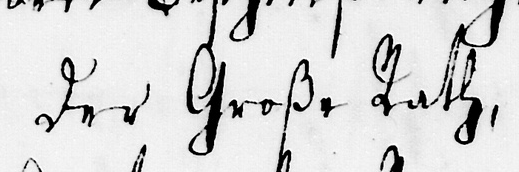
Der Große Rath,
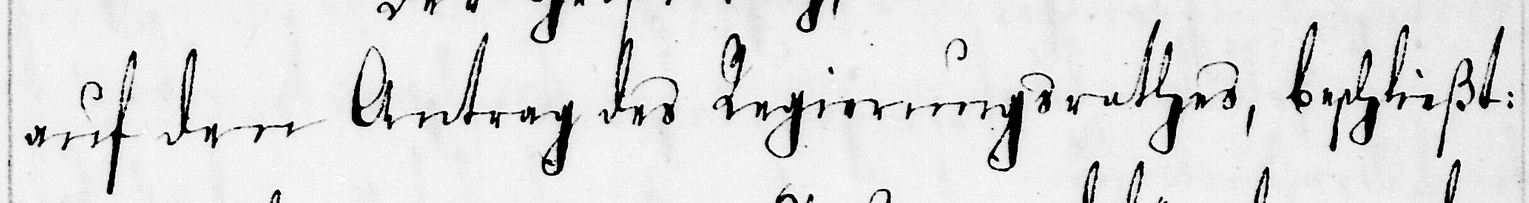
auf den Antrag des Regierungsrathes, beschließt:
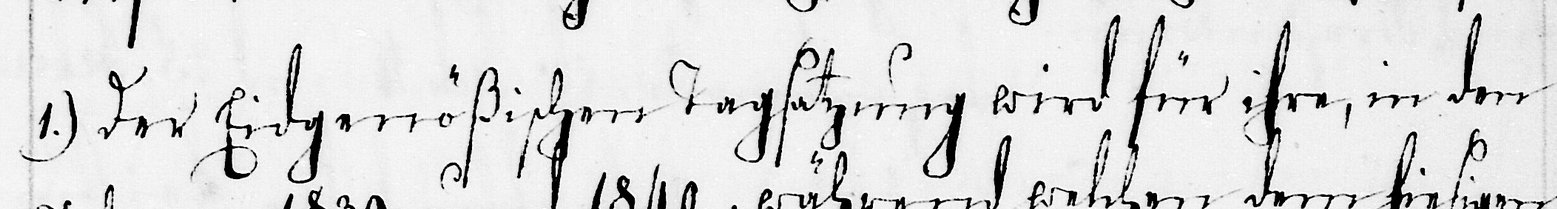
1.) Der Eidgenößischen Tagsatzung wird für ihre, in den
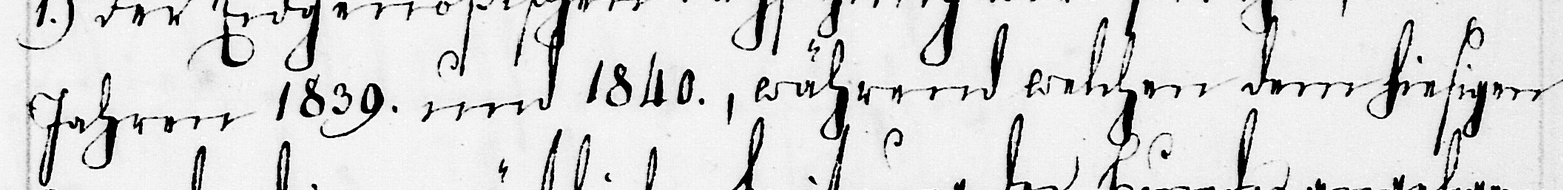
Jahren 1839. und 1840., während welchen dem hiesigen
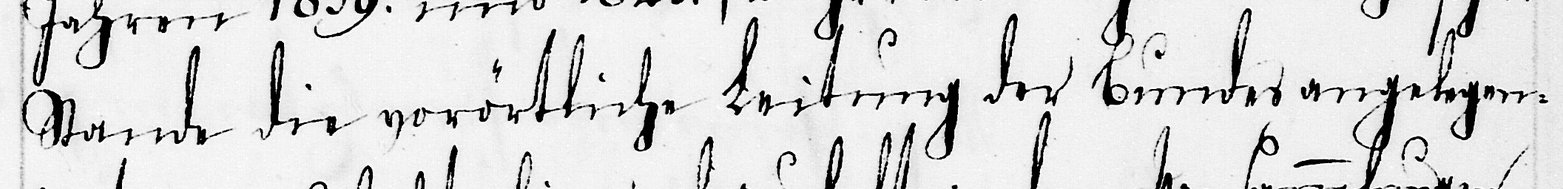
Stande die vorörtliche Leitung der Bundesangelegen¬
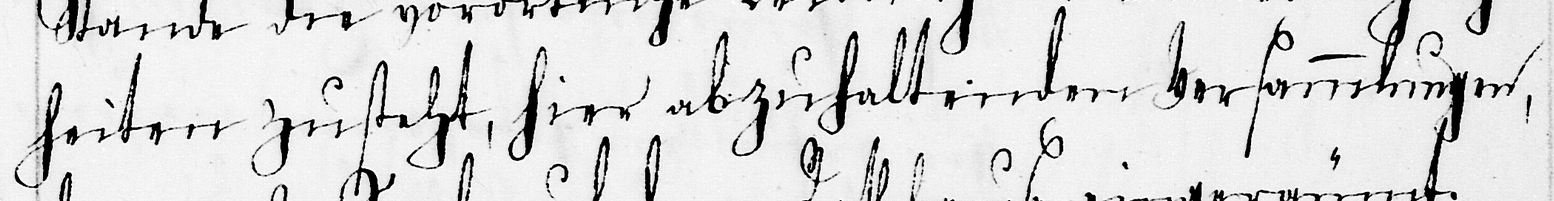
heiten zusteht, hier abzuhaltenden Versammlungen,
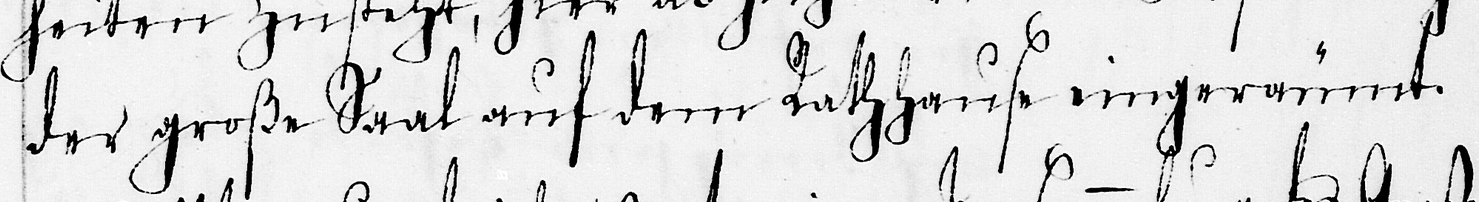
der große Saal auf dem Rathhause eingeräumt.
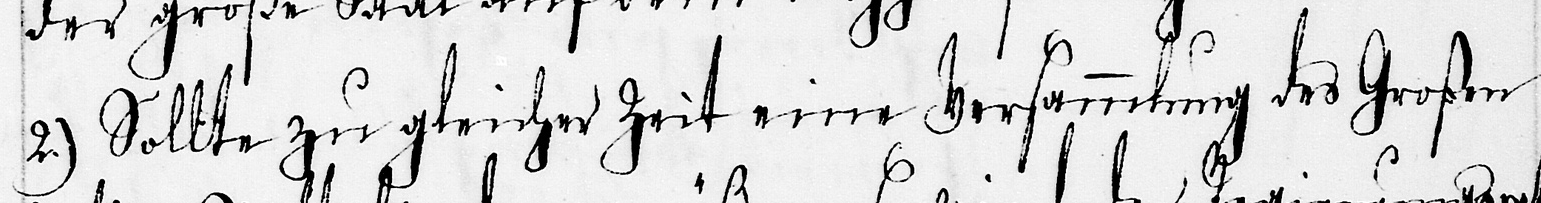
2.) Sollte zu gleicher Zeit eine Versammlung des Großen
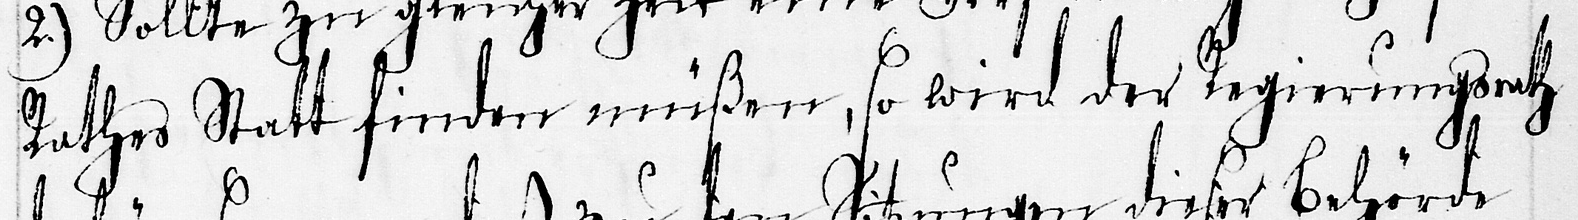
Rathes Statt finden müssen, so wird der Regierungsrath
